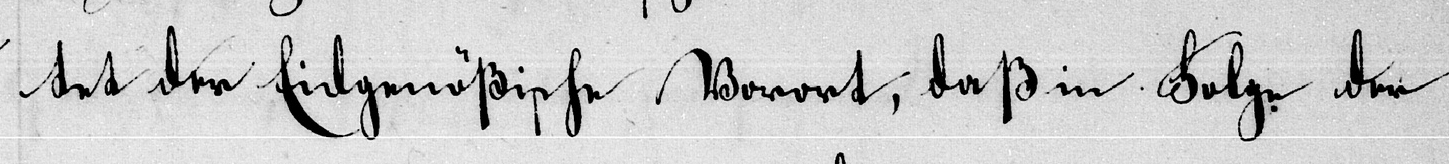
tet der Eidgenößische Vorort, daß in Folge der
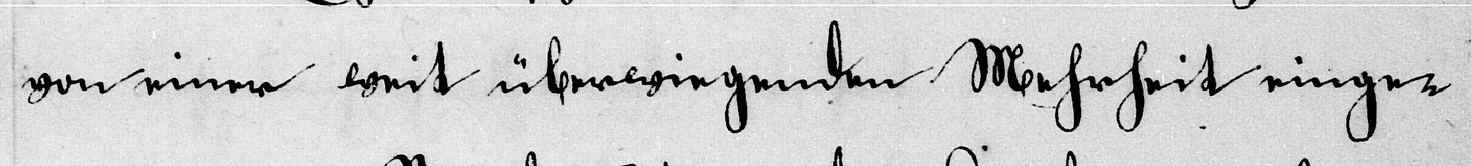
von einer weit überwiegenden Mehrheit einge¬
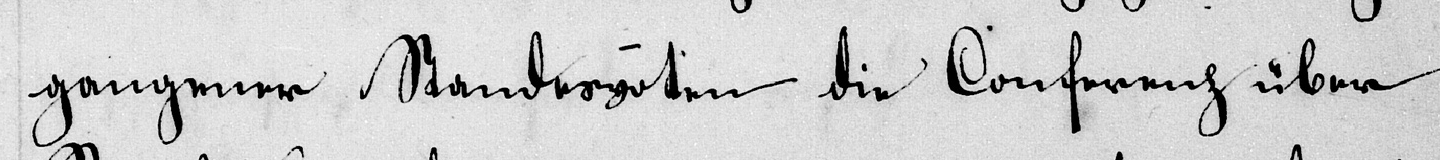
gangenen Standesvoten die Conferenz über
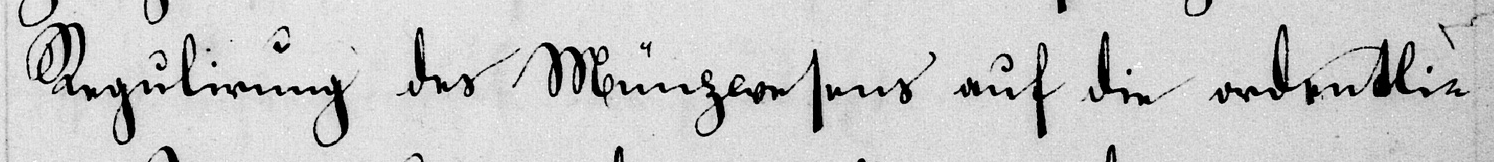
Regulirung des Münzwesens auf die ordentli¬
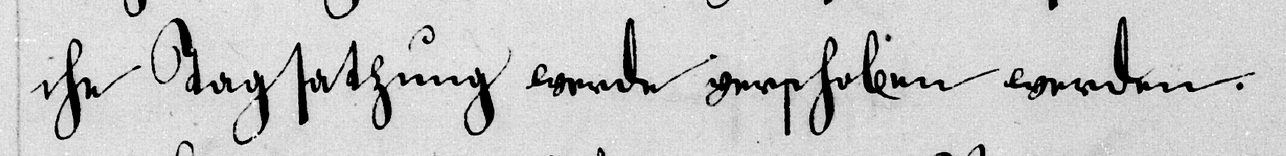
che Tagsatzung werde verschoben werden.
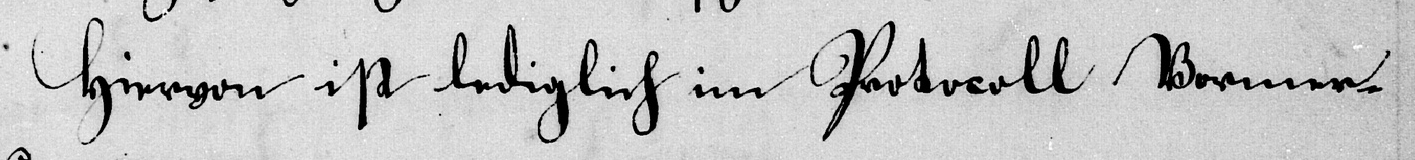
Hiervon ist lediglich im Protocoll Vormer¬
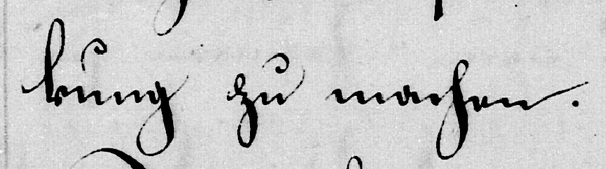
kung zu machen.
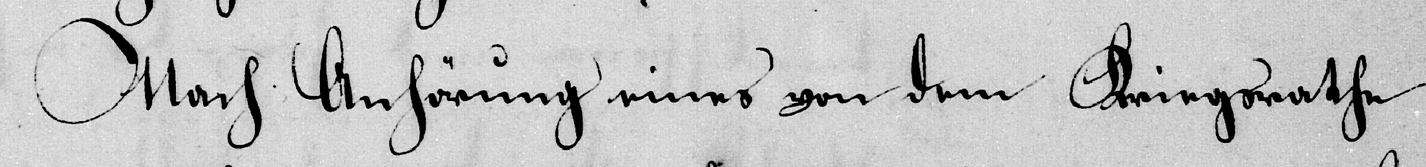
Nach Anhörung eines von dem Kriegsrathe
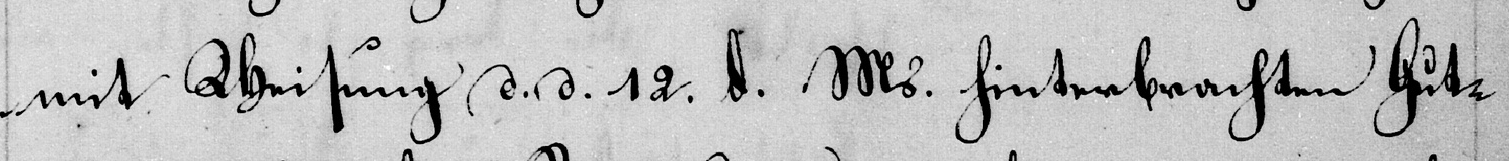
mit Weisung d. d. 12. d. Ms. hinterbrachten Gut¬
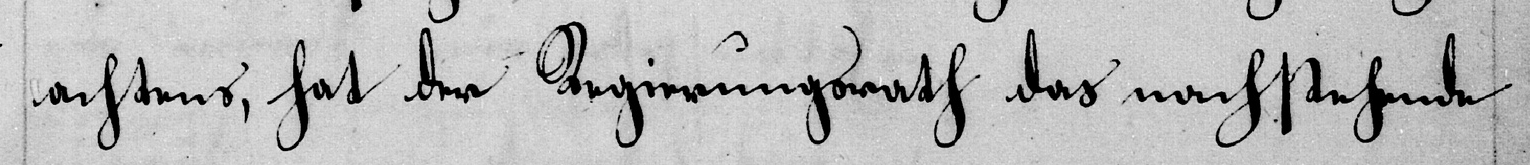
achtens, hat der Regierungsrath das nachstehende
